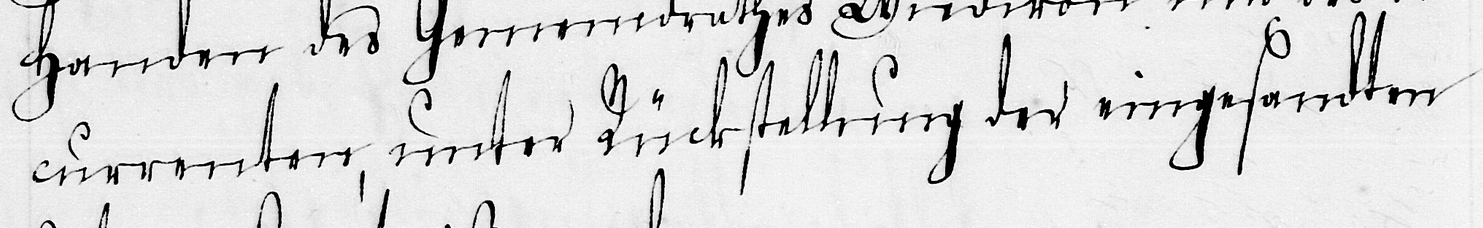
currenten, unter Rückstellung der eingesandten
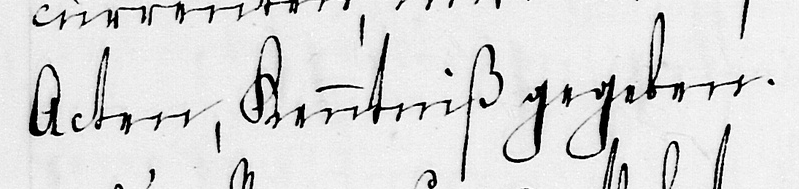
Acten, Kenntniß gegeben.
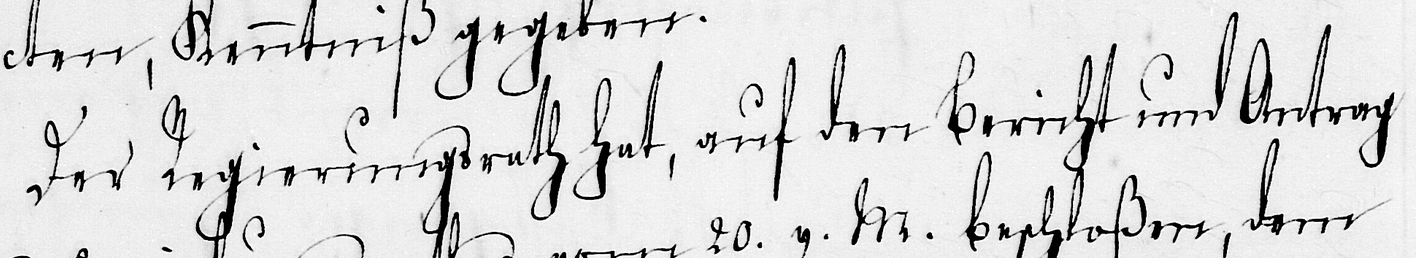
Der Regierungsrath hat, auf den Bericht und Antrag
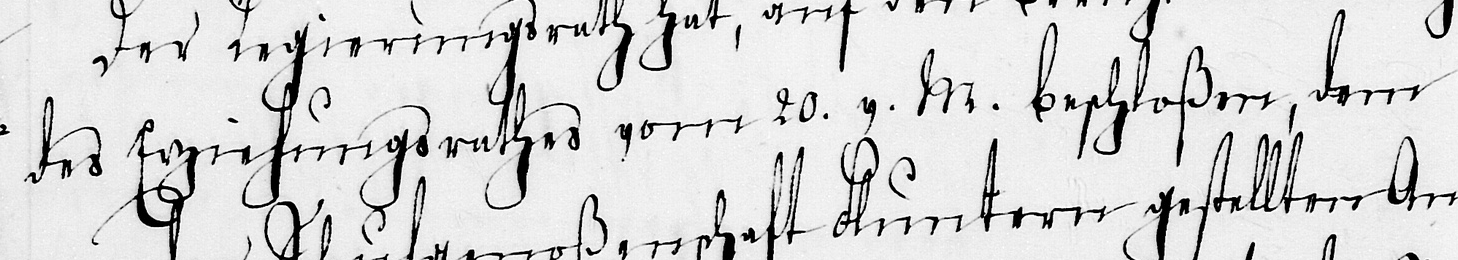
des Erziehungsrathes vom 20. v. M. beschloßen, dem
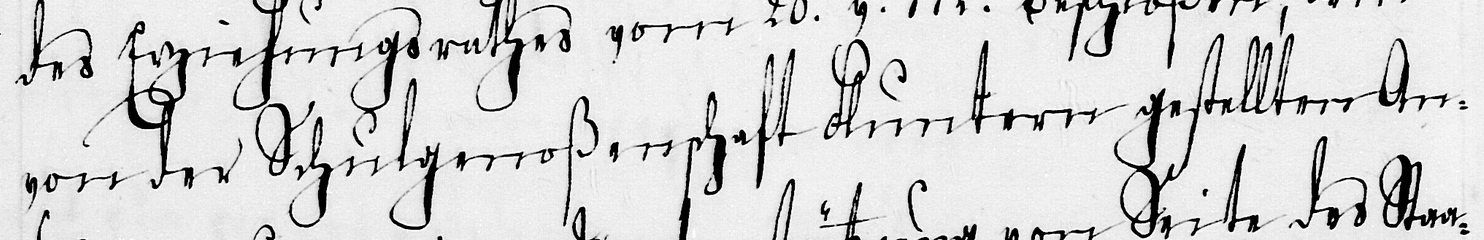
von der Schulgenoßenschaft Fluntern gestellten An¬
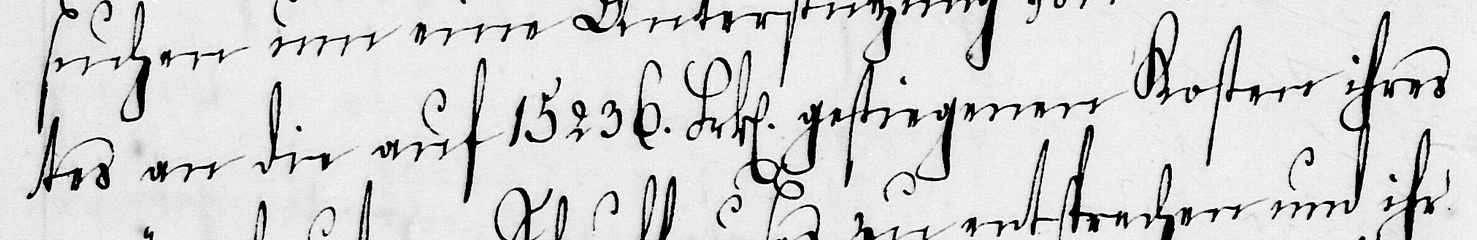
ates an die auf 15 236. Frk[en]. gestiegenen
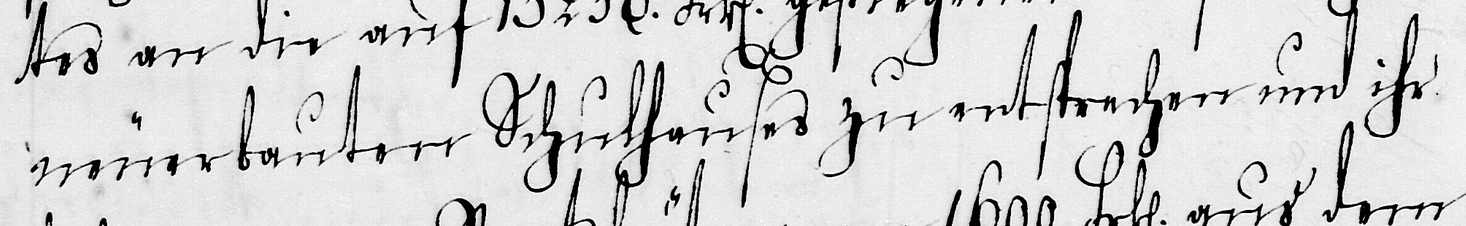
neuerbauten Schulhauses zu entsprechen und ihr
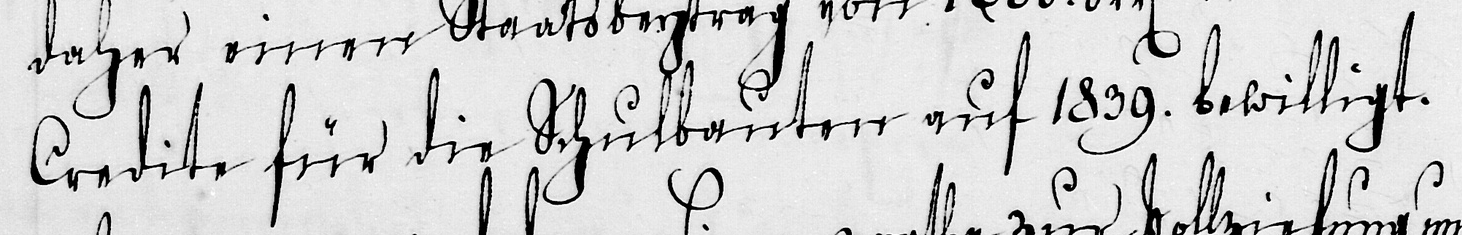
Credite für die Schulbauten auf 1839. bewilligt.
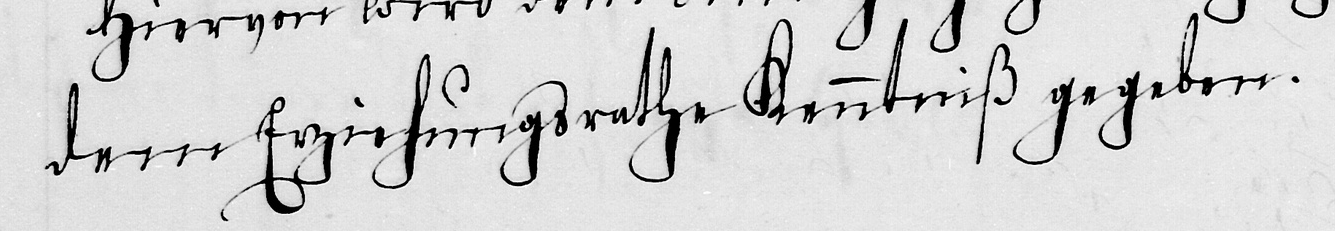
dem Erziehungsrathe Kenntniß gegeben.
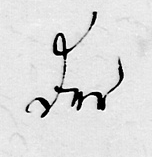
dem
